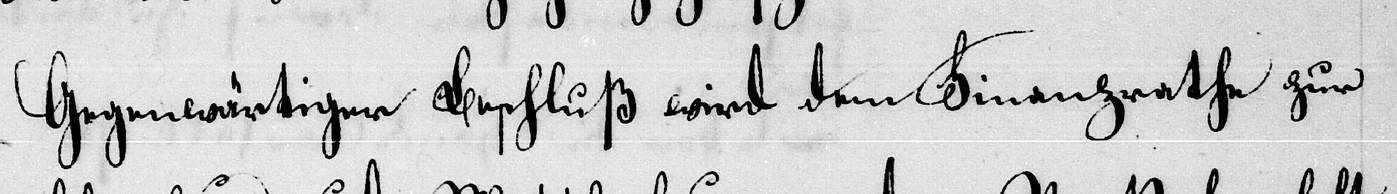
Gegenwärtiger Beschluß wird dem Finanzrathe zur
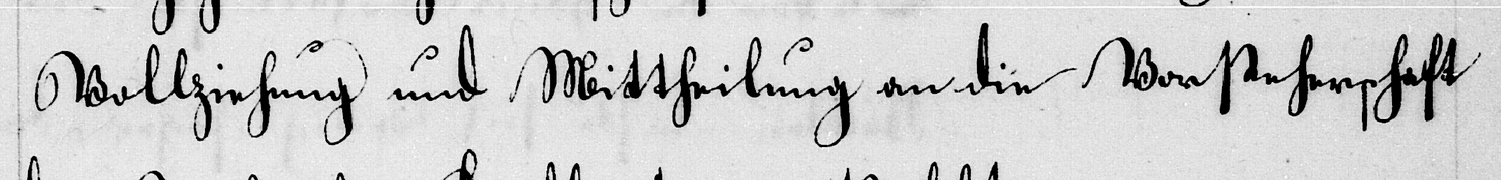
Vollziehung und Mittheilung an die Vorsteherschaft
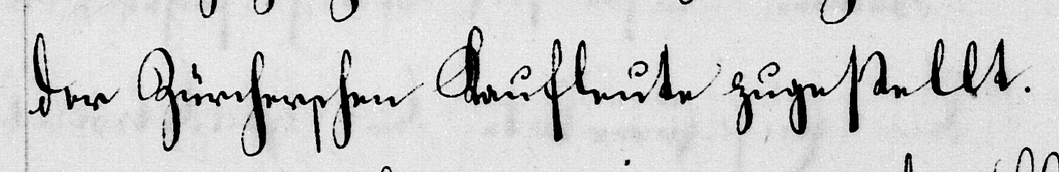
der Zürcherschen Kaufleute zugestellt.
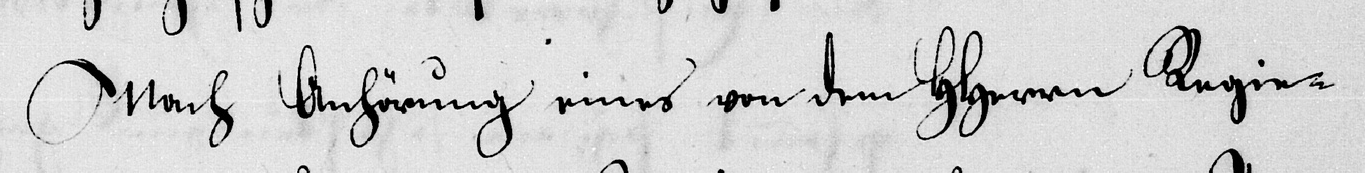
Nach Anhörung eines von dem HHerrn Regie¬
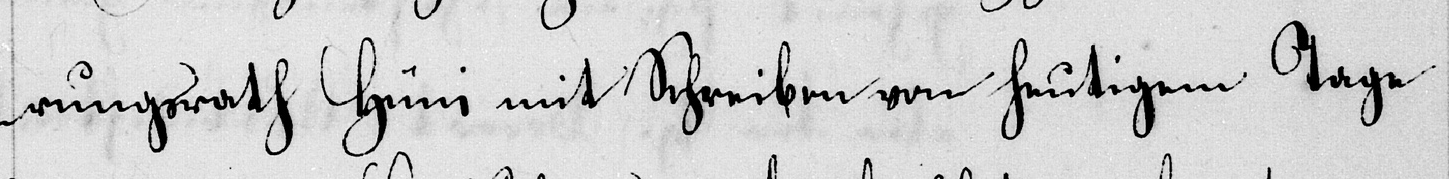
rungsrath Hüni mit Schreiben von heutigem Tage
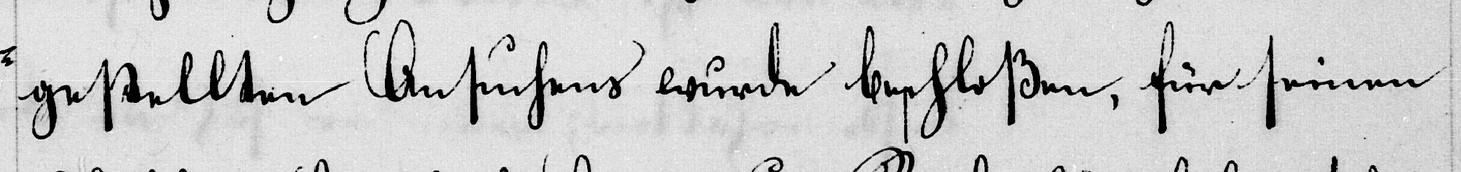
gestellten Ansuchens wurde beschloßen, für seinen
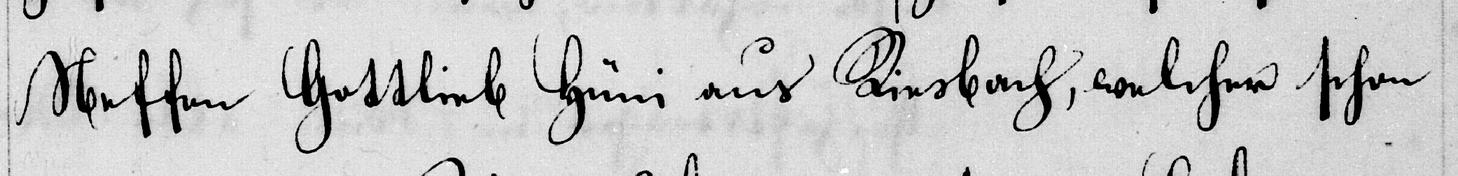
Neffen Gottlieb Hüni aus Riesbach, welcher schon
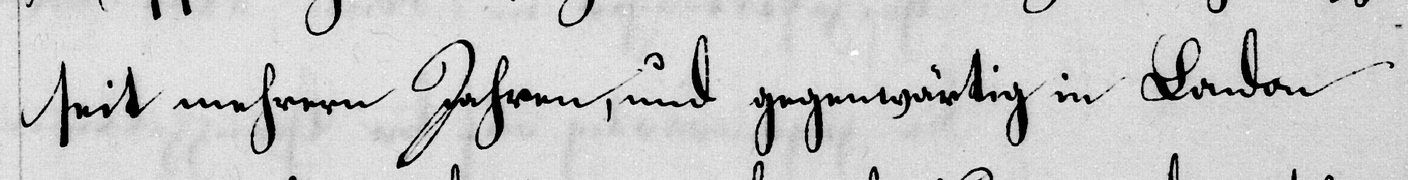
seit mehrern Jahren, und gegenwärtig in London
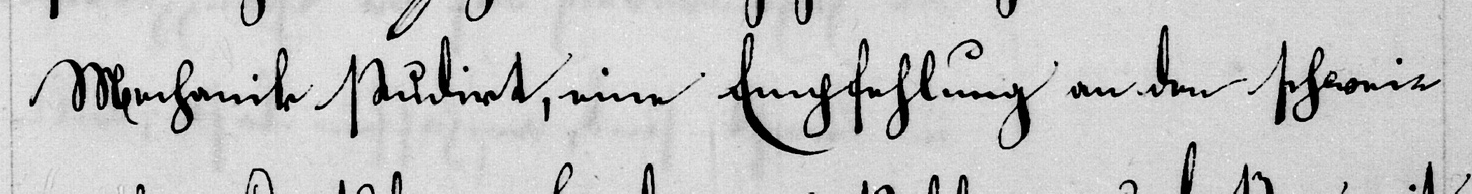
Mechanik studirt, eine Empfehlung an den schwei¬
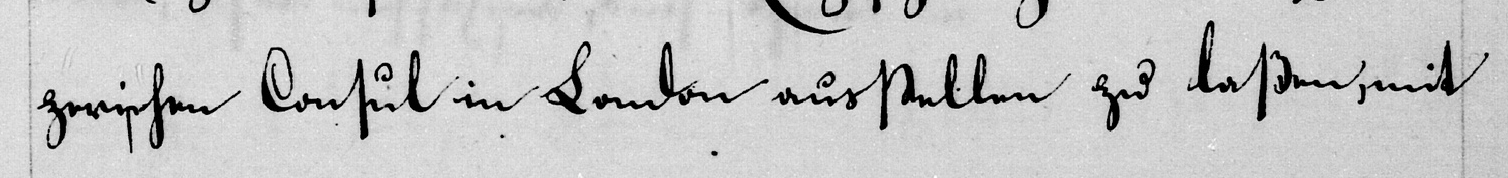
zerischen Consul in London ausstellen zu laßen, mit
